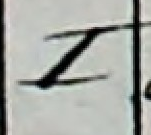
I
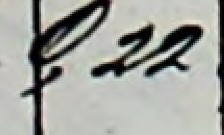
0,22
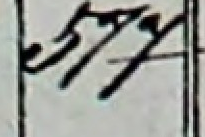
577
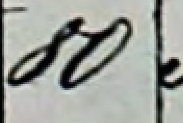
8
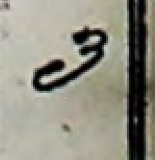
3
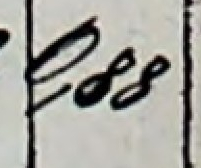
0,88
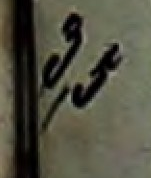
3,5
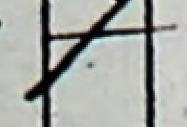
7
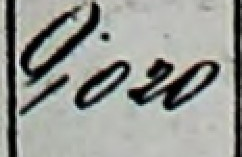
0,020
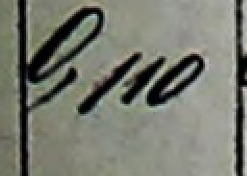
0,110
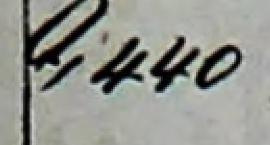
0,440
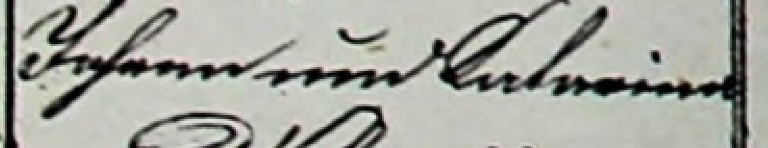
Johann und Katarina
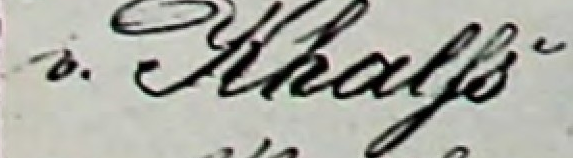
v. Khalss
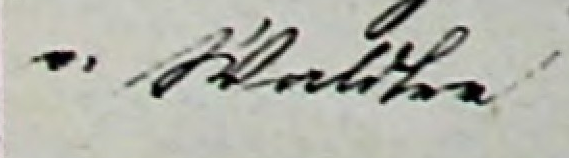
v. Waldten
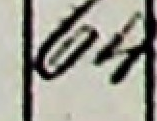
64
